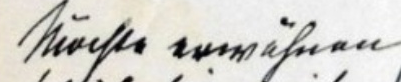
Möchte erwähnen
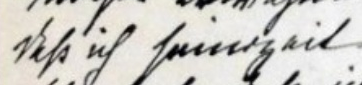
daß ich seinerzeit
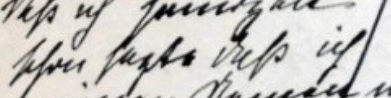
schon sagte, daß ich
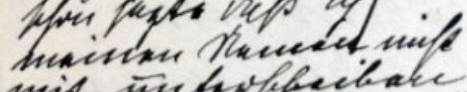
meinen Namen nicht
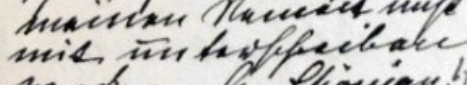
mit unterschreiben
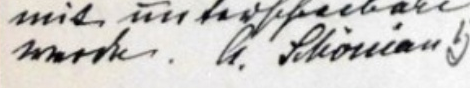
werde A. Schönian
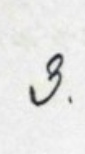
3
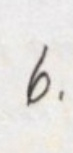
6
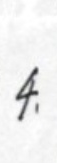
4
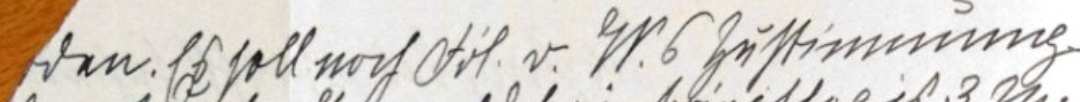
den. Es soll noch Frl. v. Ws Zustimmung
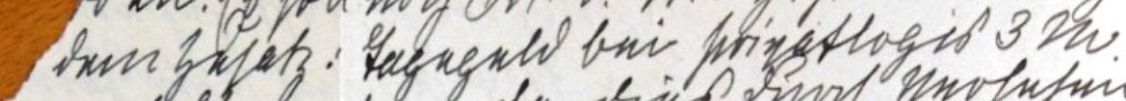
dem Zusatz: Tagegeld bei Privatlogis 3M
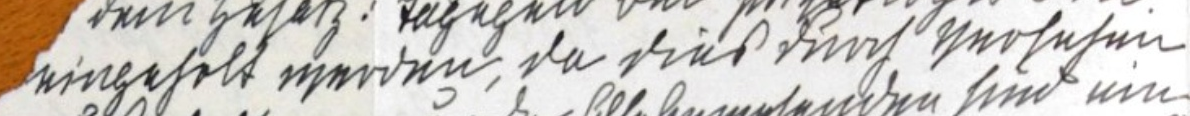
eingeholt werden, da dies durch Versehen
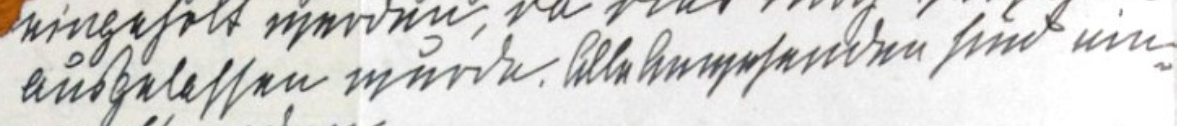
einschlossen wurde. Alle Anwesenden sind ein
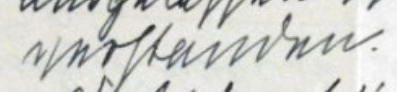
verstanden.
